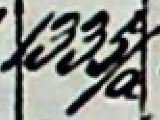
1335/a
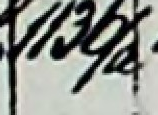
1336/a
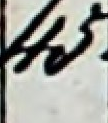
45
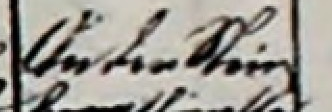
An der Stein
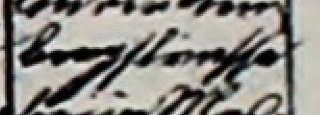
bergstrasse
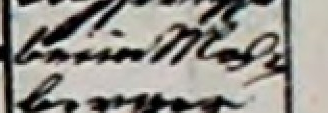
beim Mal„
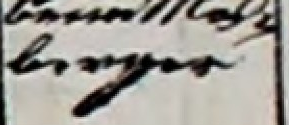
berger
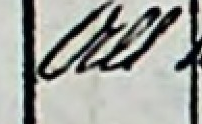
Alt
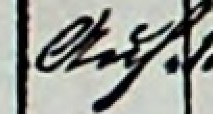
Aus„
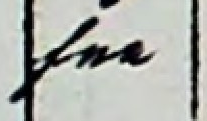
see
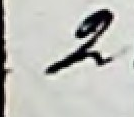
2
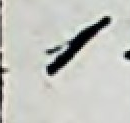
1
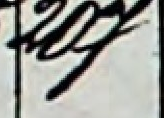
207
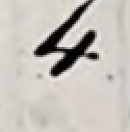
4
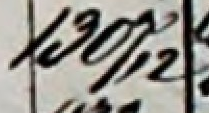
1307,2
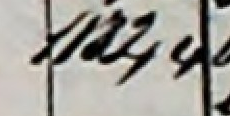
1182,4
